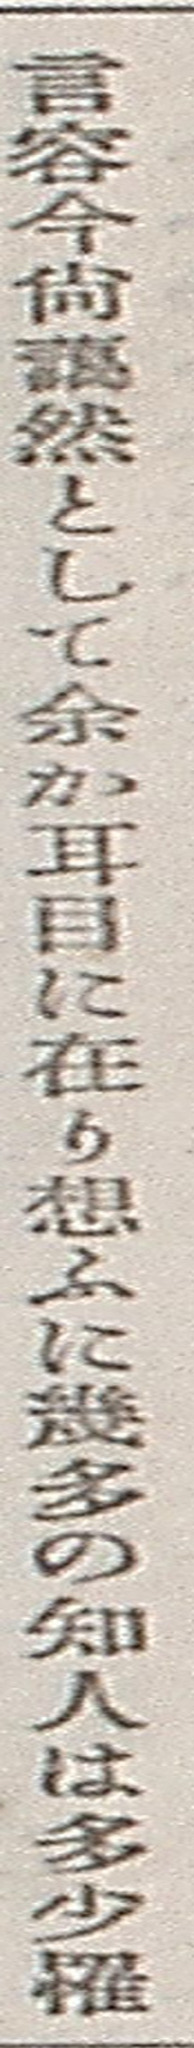言容今尚藹然として余か耳目に在り想ふに幾多の知人は多少罹
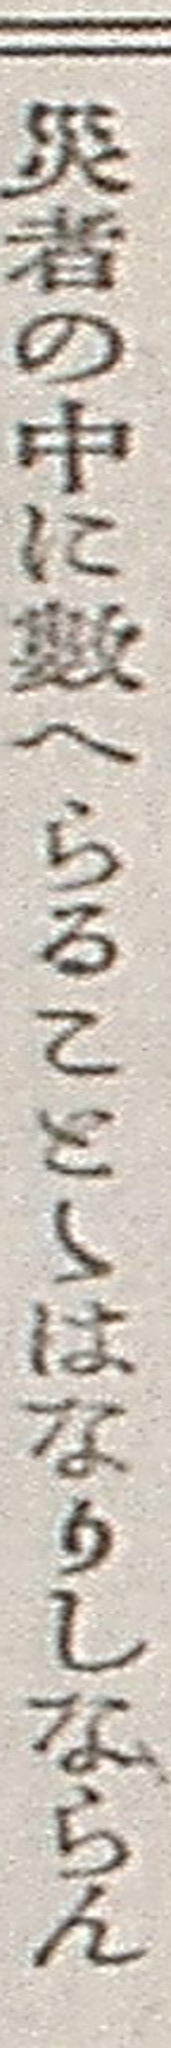災者の中に数へらることゝはなりしならん
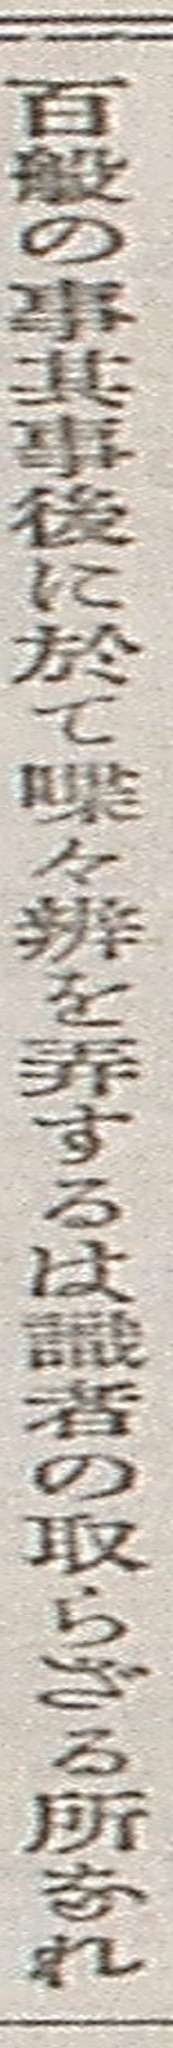百般の事其事後に於て喋々弁を弄するは識者の取らざる所なれ
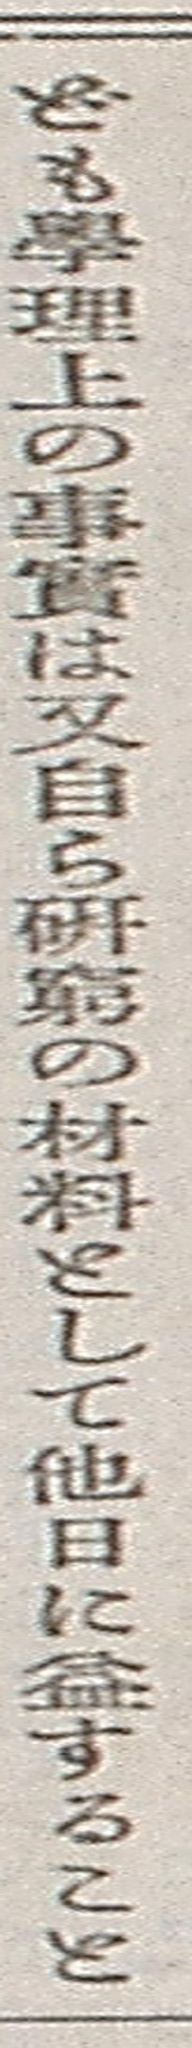ども学理上の事実は又自ら研窮の材料として他日に益すること
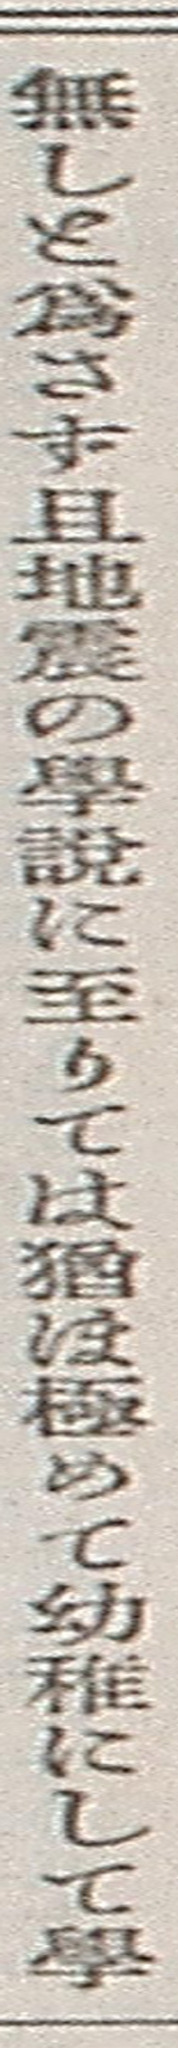無しと為さず且地震の学説に至りては猶ほ極めて幼稚にして学
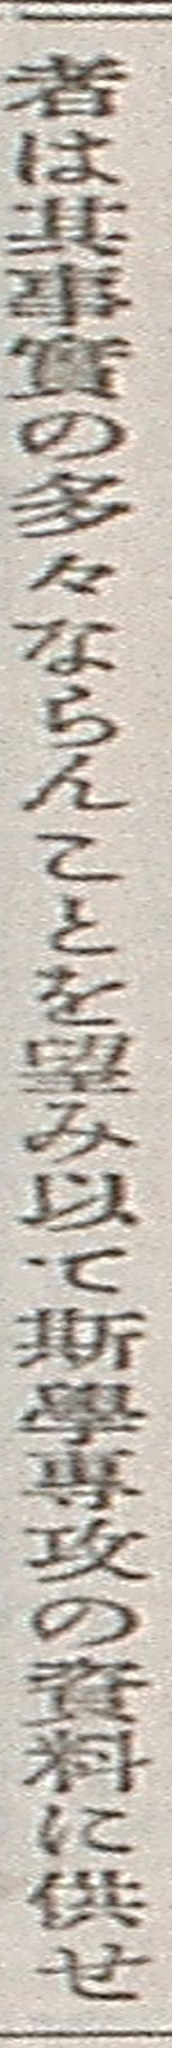者は其事実の多々ならんことを望み以て斯学専攻の資料に供せ
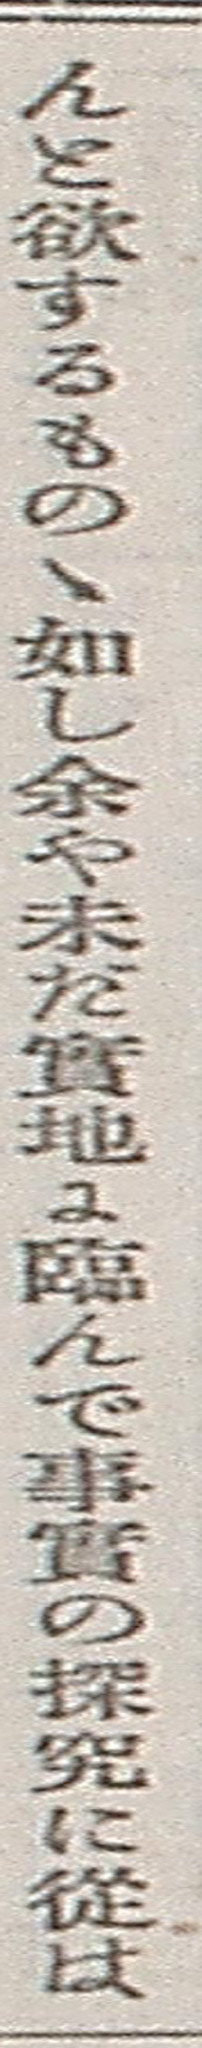んと欲するものゝ如し余や未だ実地に臨んで事実の探究に従は

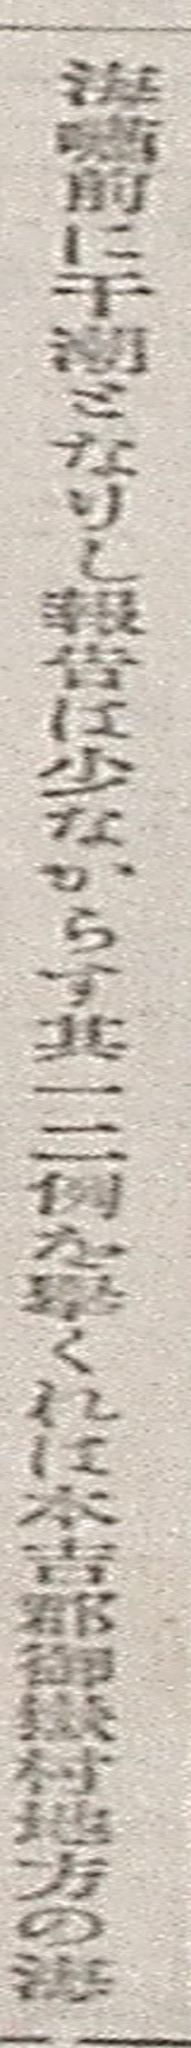海嘯前に干潮となりし報告は少なからす其一二例を挙くれは本吉郡御嶽村地方の海
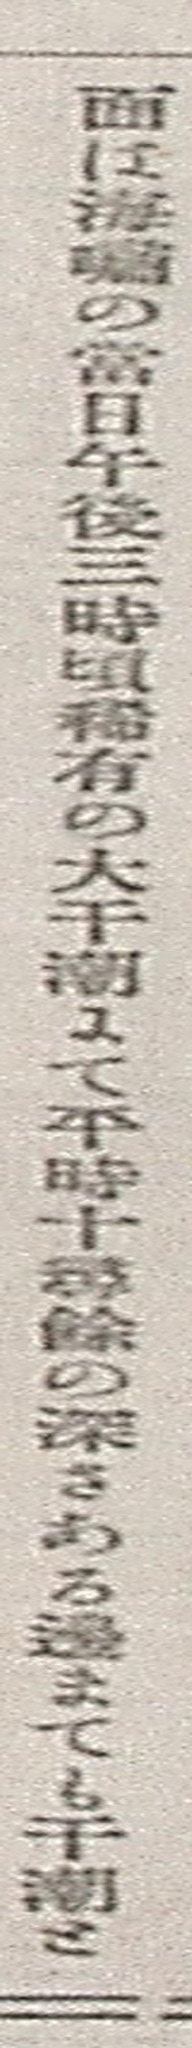面は海嘯の当日午後三時頃稀有の大干潮にて平時十尋余の深さある辺まても干潮と
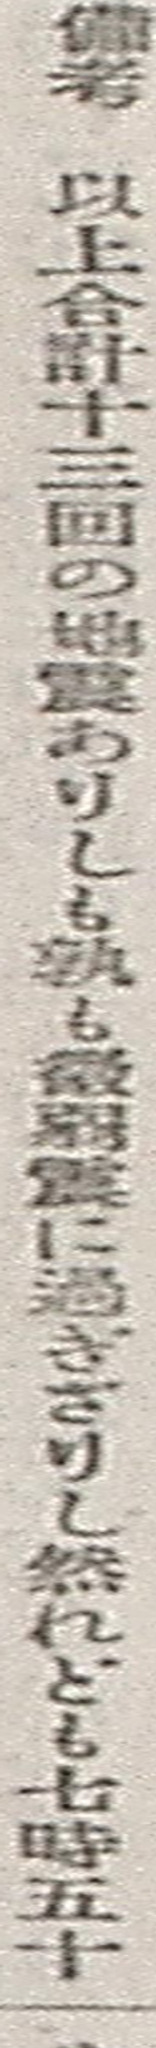備考以上合計十三回の地震ありしも孰も微弱震に過ぎざりし然れども七時五十
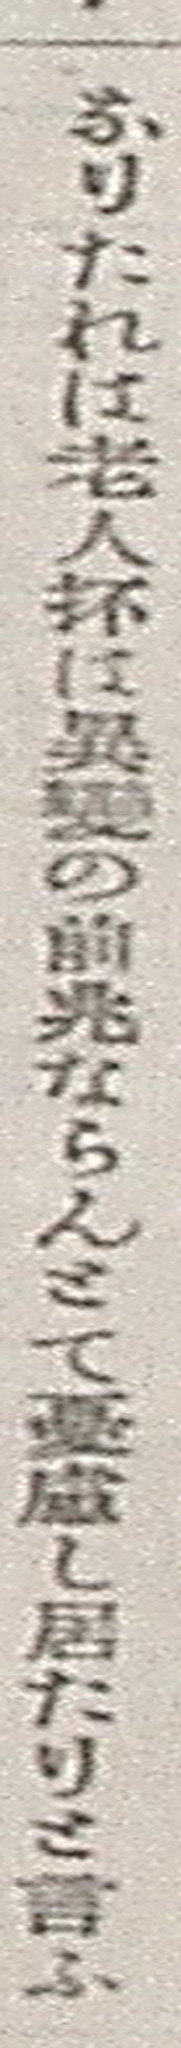なりたれは老人抔は異変の前兆ならんとて憂慮し居たりと言ふ
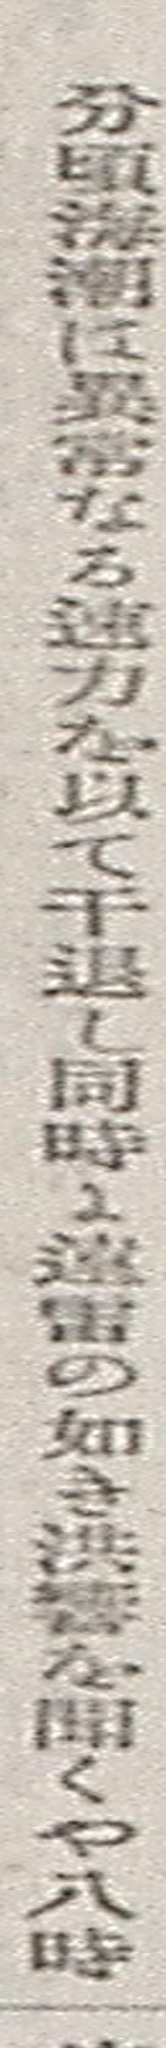分頃海潮は異常なる速力を以て干退し同時に遠雷の如き洪響を聞くや八時
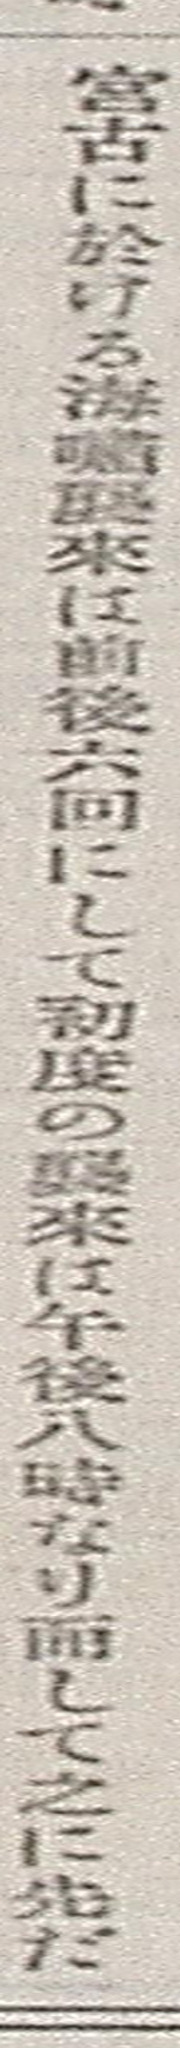宮古に於ける海嘯襲来は前後六回にして初度の襲来は午後八時なり而して之に先だ
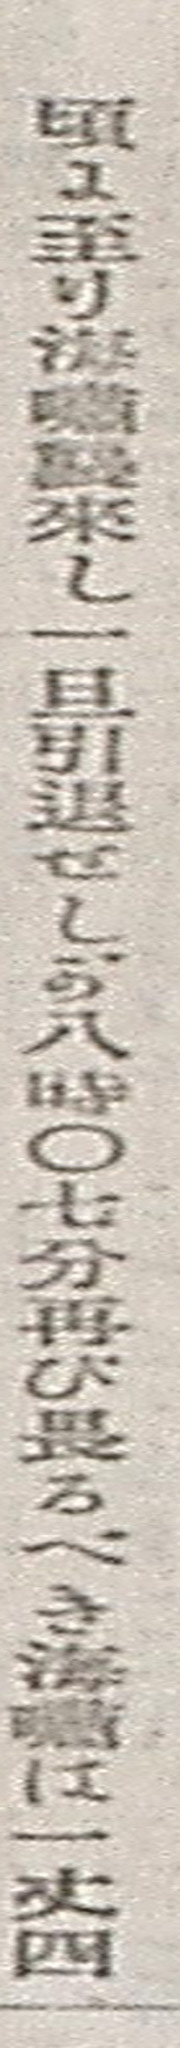頃に至り海嘯襲来し一旦引退せしが八時〇七分再び畏るべき海嘯は一丈四
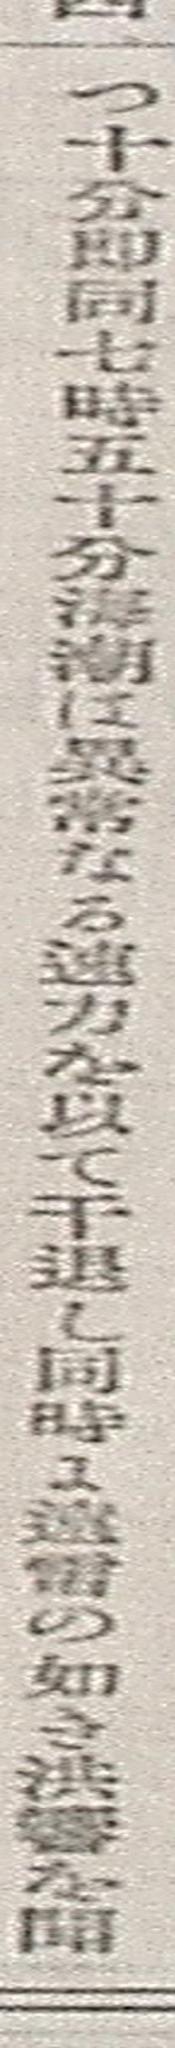つ十分即同七時五十分海潮は異常なる速力を以て干退し同時に遠雷の如き洪響を聞
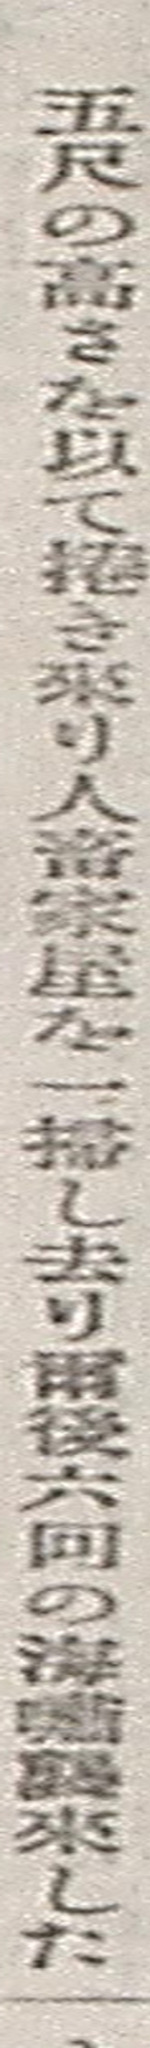五尺の高さを以て捲き来り人畜家屋を一掃し去り爾後六回の海嘯襲来した
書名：風俗畫報臨時増刊第百十九號　大海嘯被害録（中）
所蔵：東京大学地震研究所図書室 Earthquake Research Institute Library, The University of Tokyo, JAPAN
